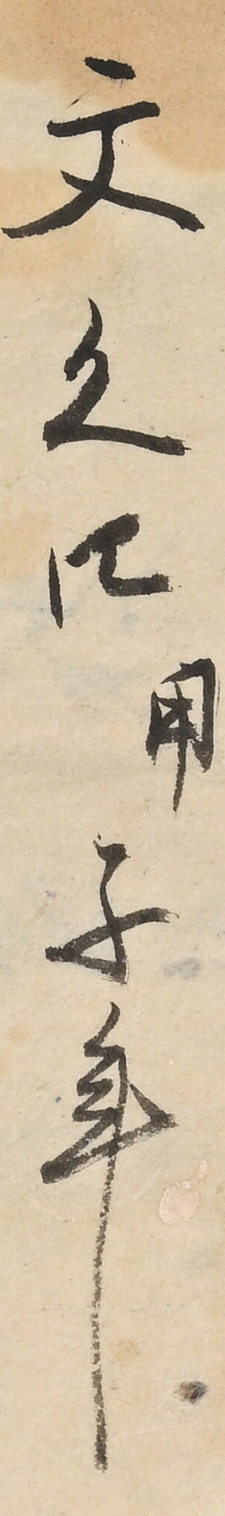㊞文久四甲子年
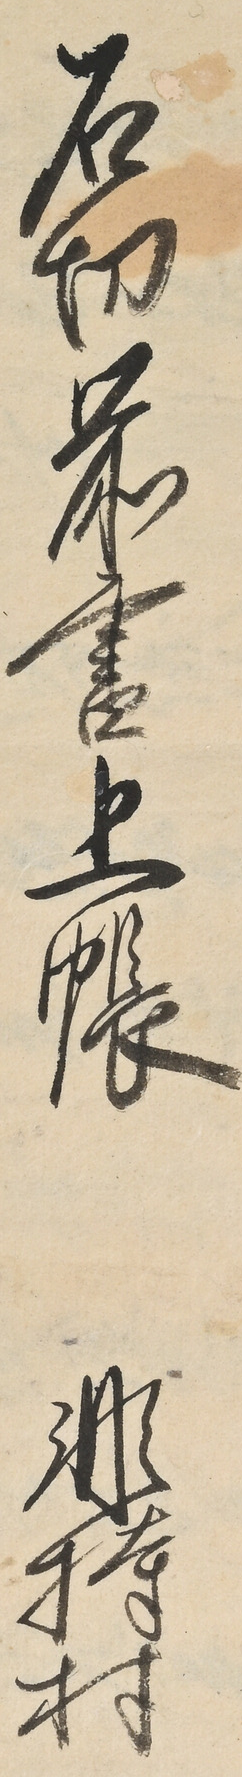石切前書上帳非持村

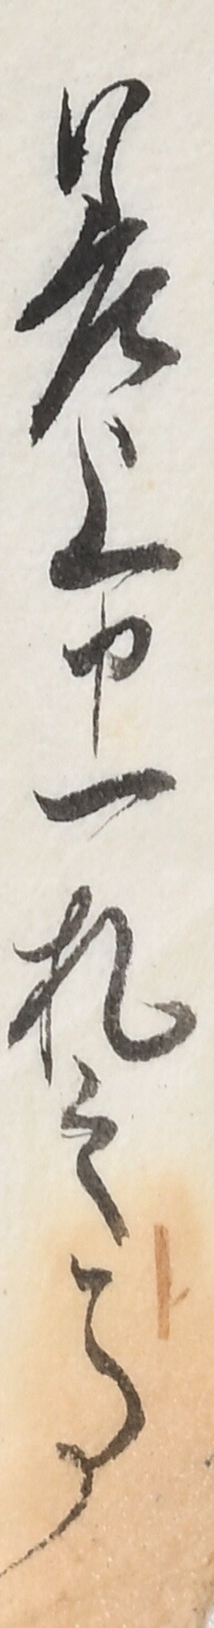差上申一札之事
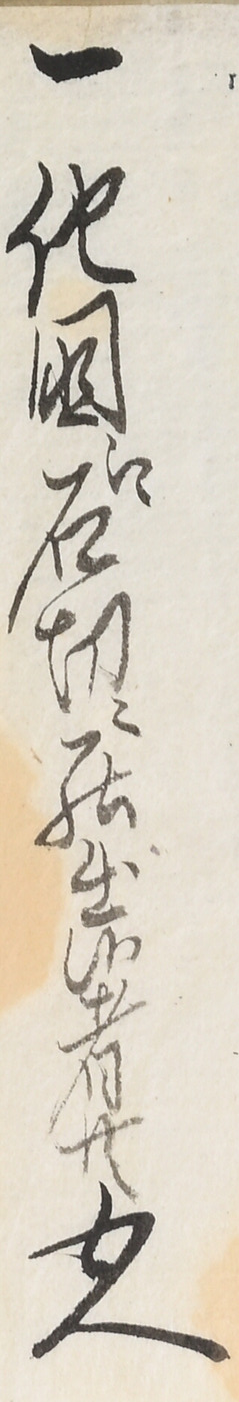一他国え石切ニ罷出候者共五人
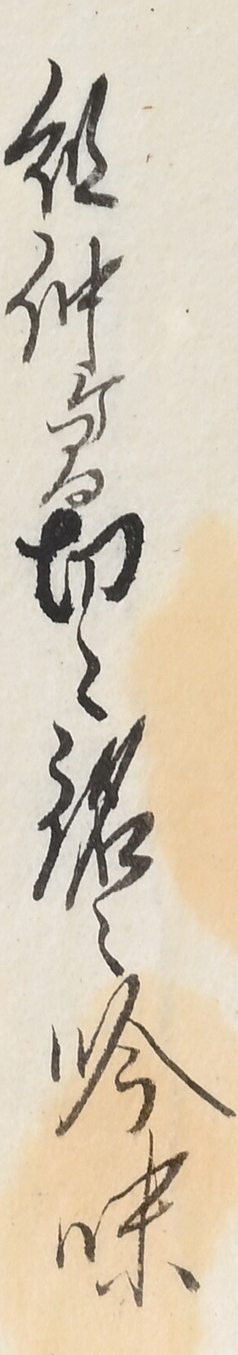組仲ケ間切々銘々吟味
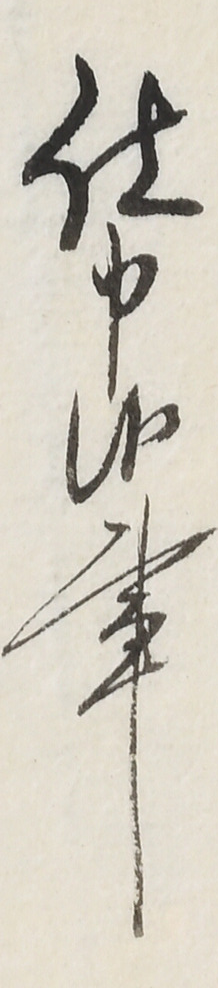仕申候事
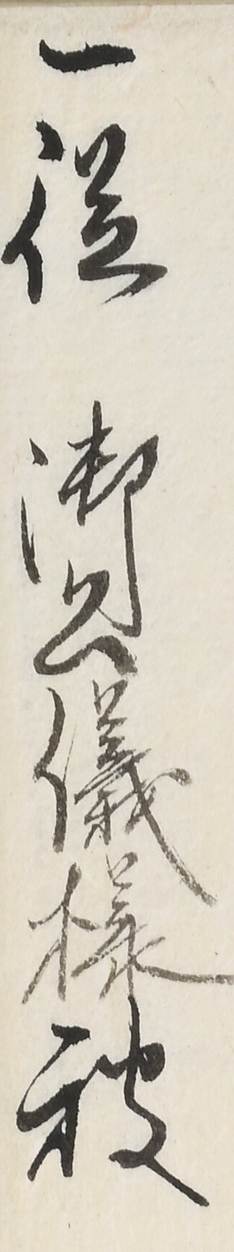一従御公儀様被
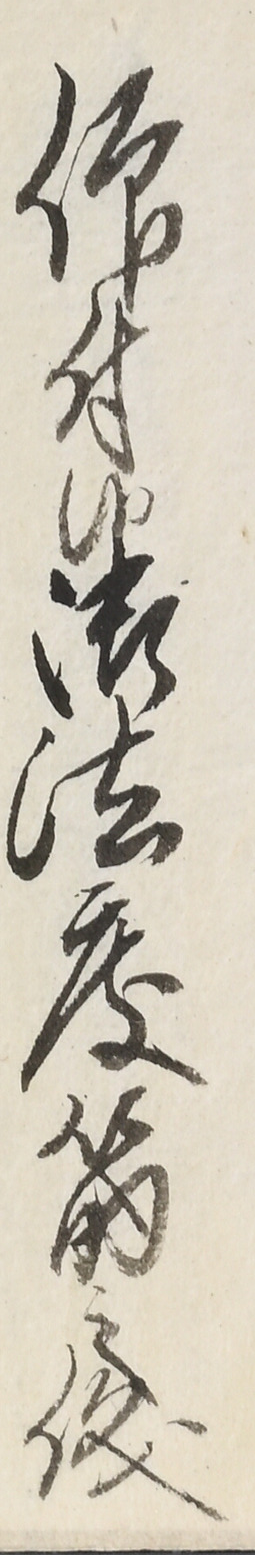仰付候御法度筋之儀
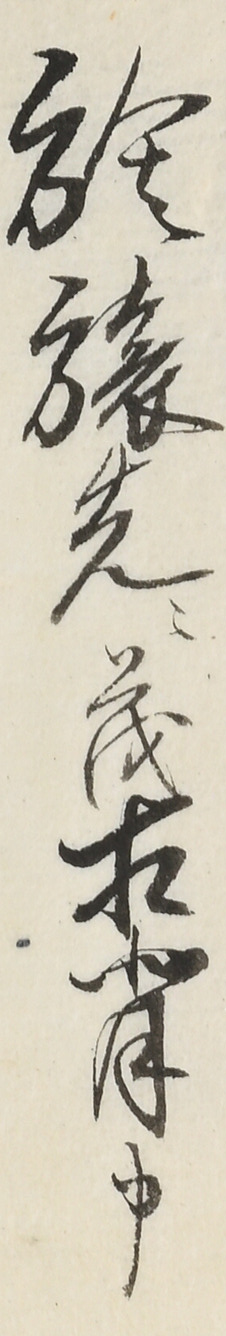於旅先ニも相背申
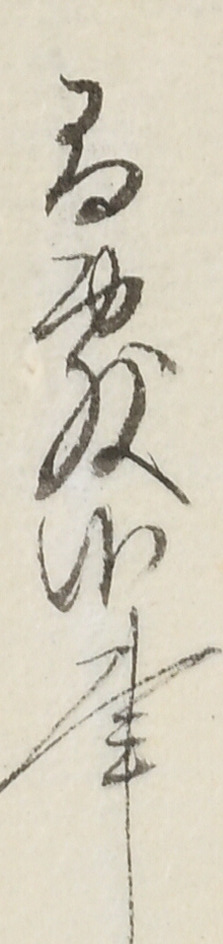間敷候事
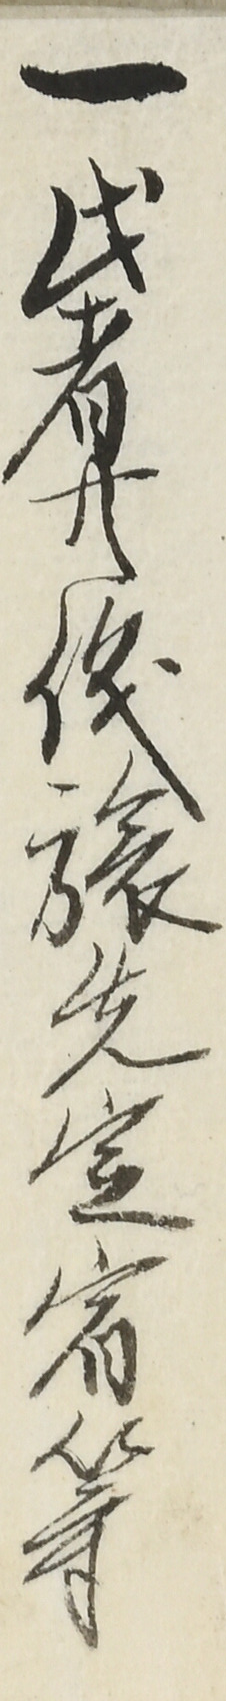一此者共儀旅先定宿等
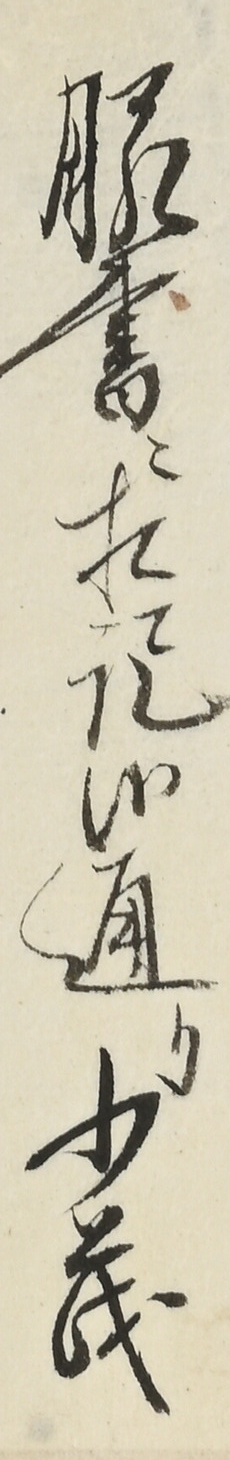脇書ニ相記候通リ少も
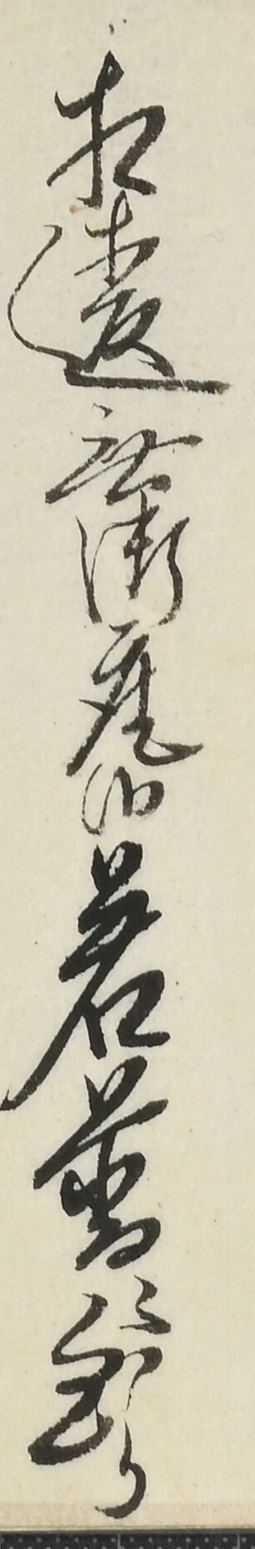相違無御座候若暮ニ至り

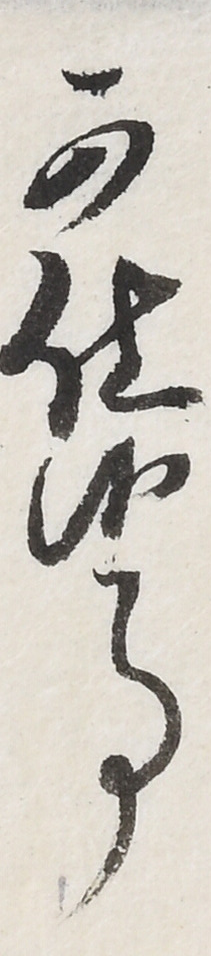可仕候事
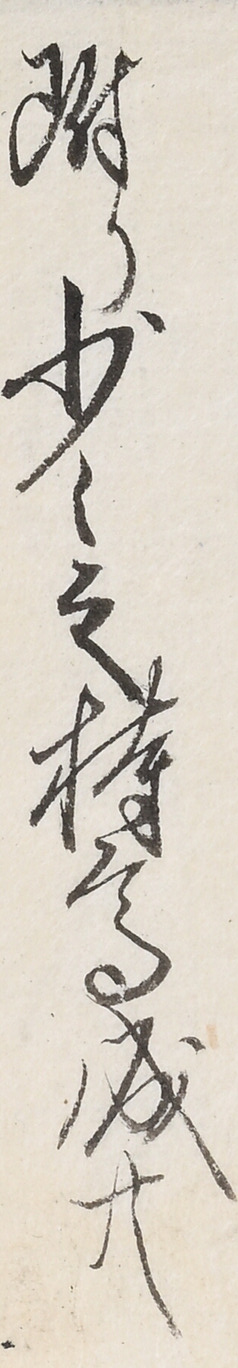附リ少々之持高成共
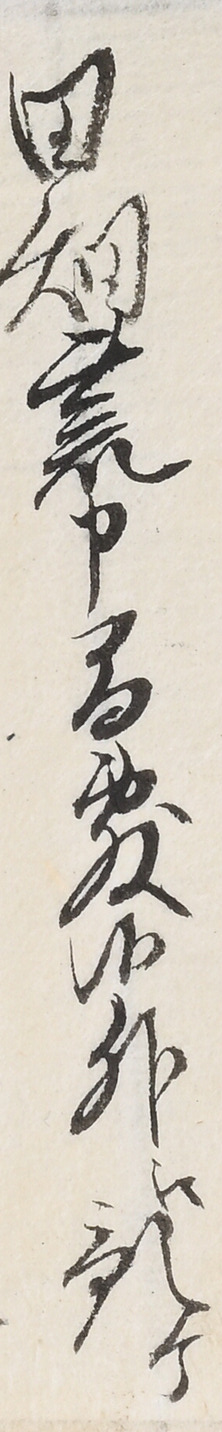田畑荒申間敷候外え預ケ
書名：文久四甲子年二月石切名前書上帳
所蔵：伊那市立高遠町図書館・合同会社AMANE
